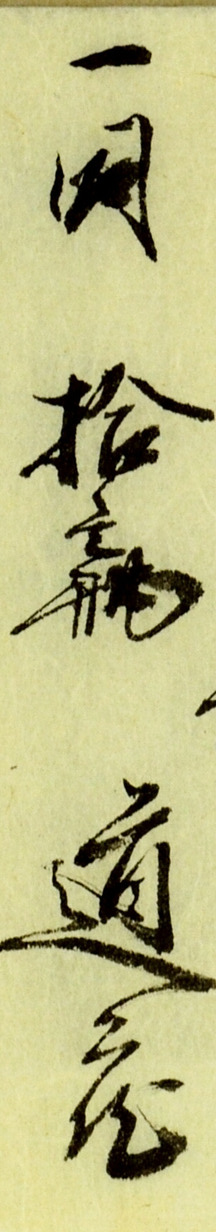一同拾壱瓶道蔵
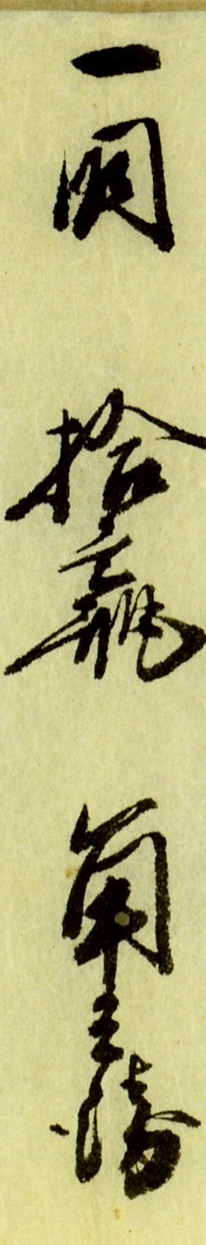一同拾壱瓶角兵衛
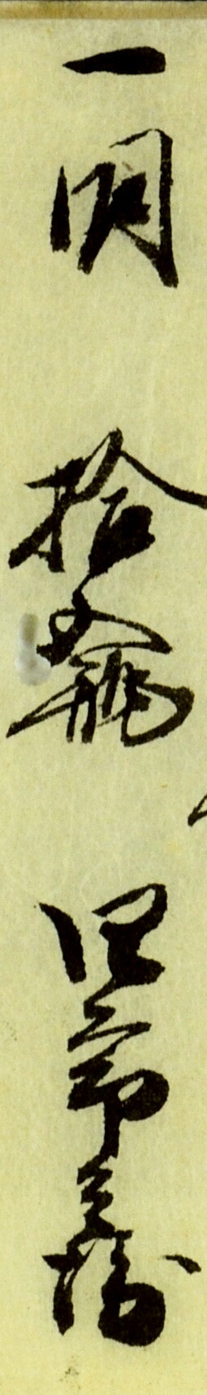一同拾五瓶四郎兵衛
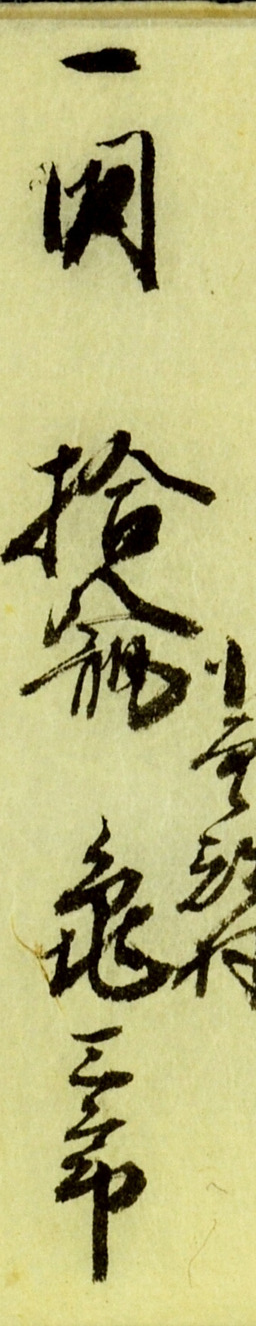一同拾八瓶亀三郎
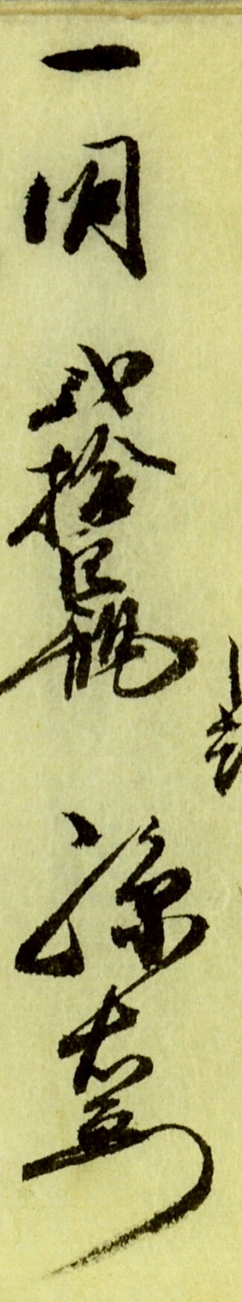一同弐拾四瓶孫右衛門
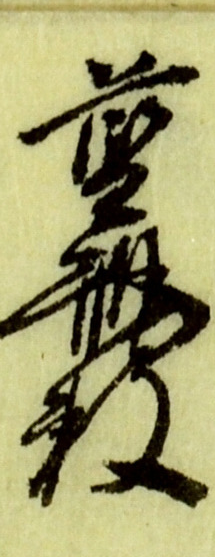藍瓶数
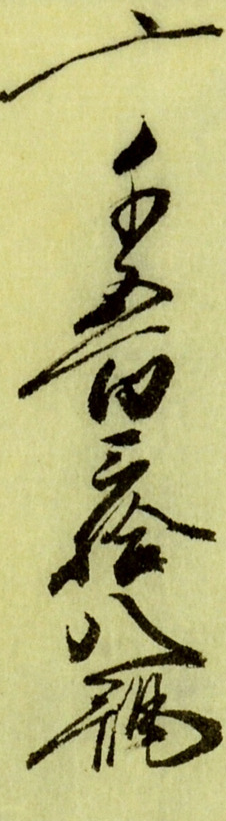〆千五百三拾八瓶

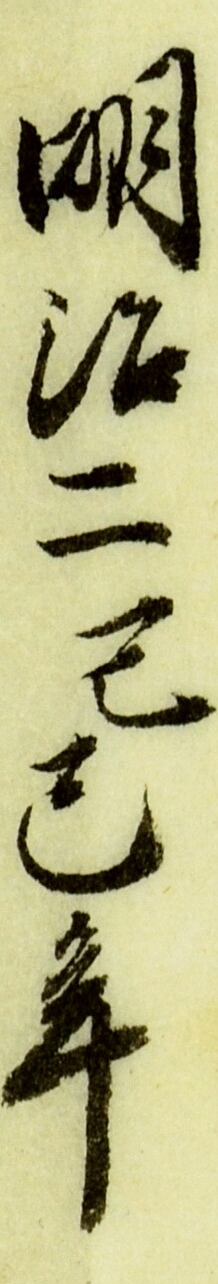明治二己巳年
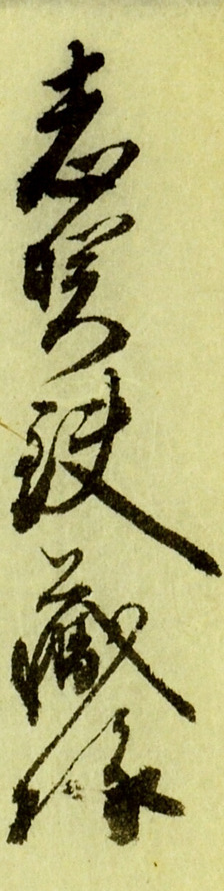志賀鉄蔵様
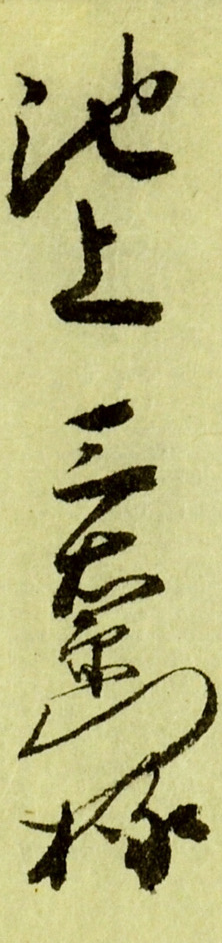池上三右衛門様
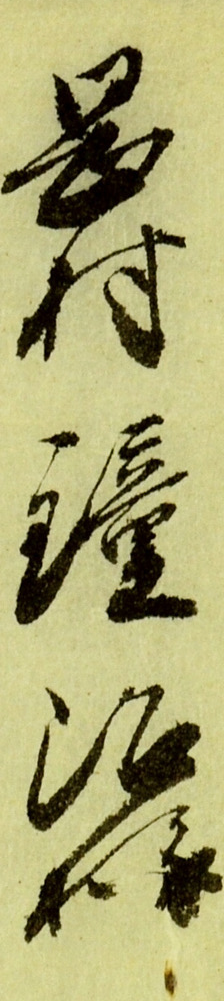岡村鐘治様
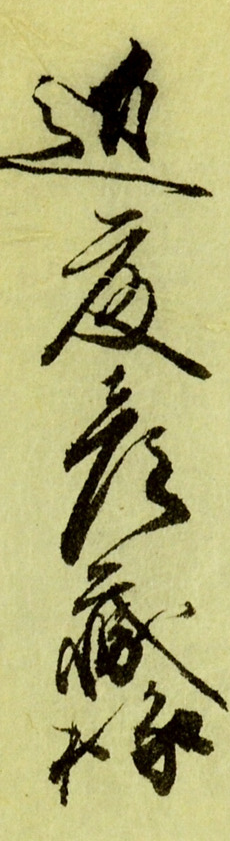近藤彦蔵様

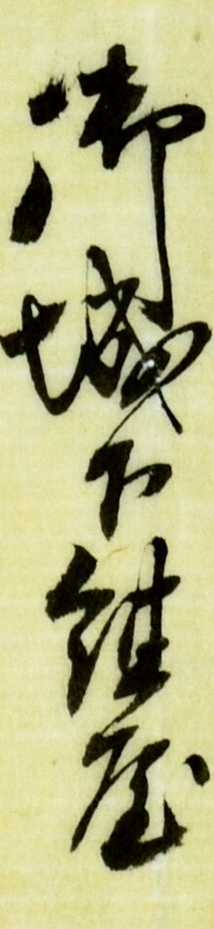御城下紺屋
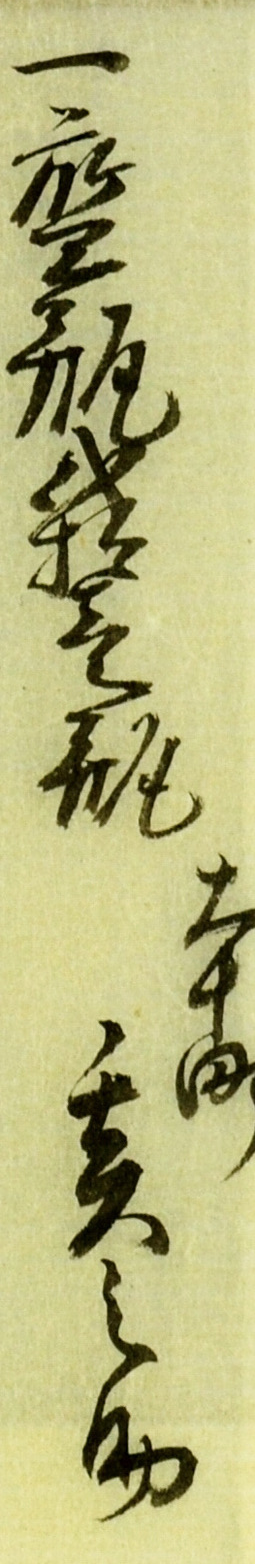一藍瓶弐拾壱瓶亥之助
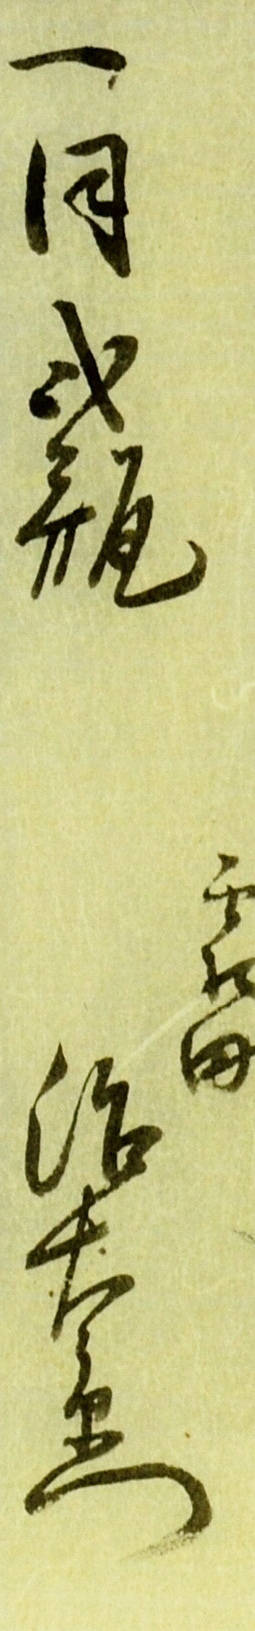一同弐瓶治右衛門
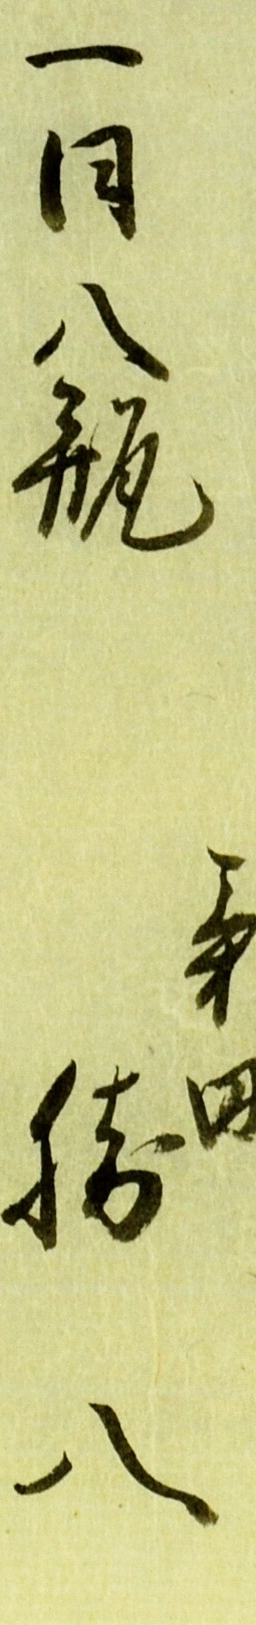一同八瓶勝八
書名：御領分中御領分中紺屋藍瓶員数御改帳
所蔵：伊那市立高遠町図書館・合同会社AMANE
